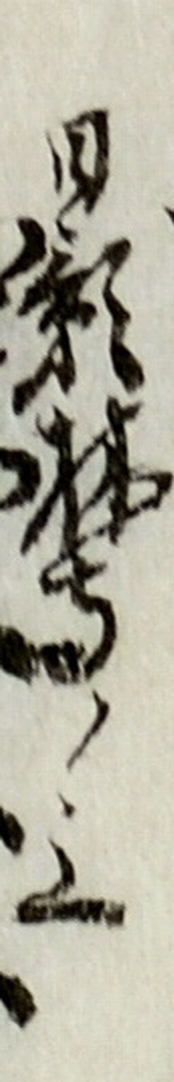日影林寺ノ上
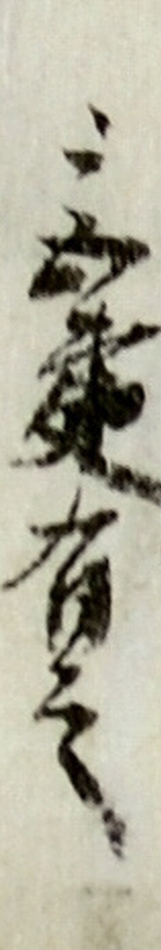宮建有之
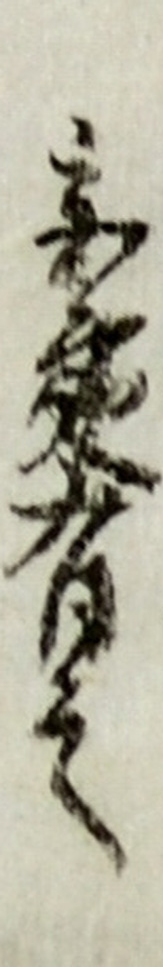宮建有之

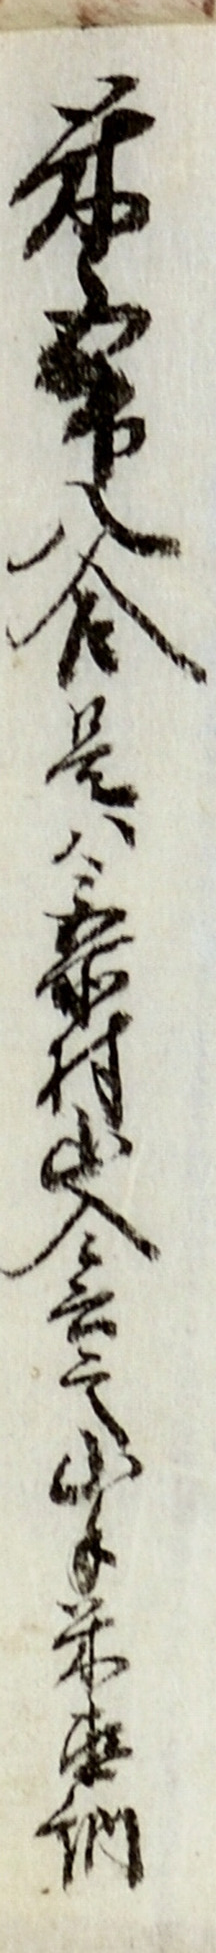米五升八合是ハ宮所村山入会之山手米直納

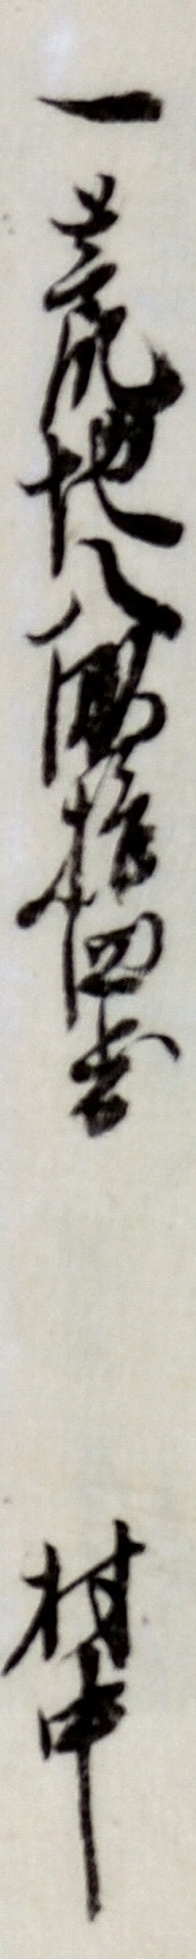一荒地八畝拾四歩村中
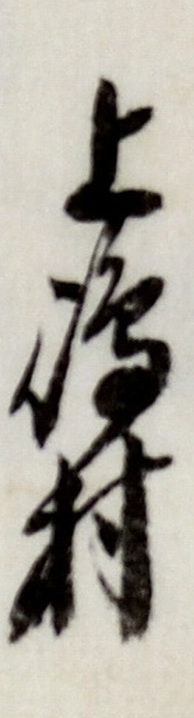上島村
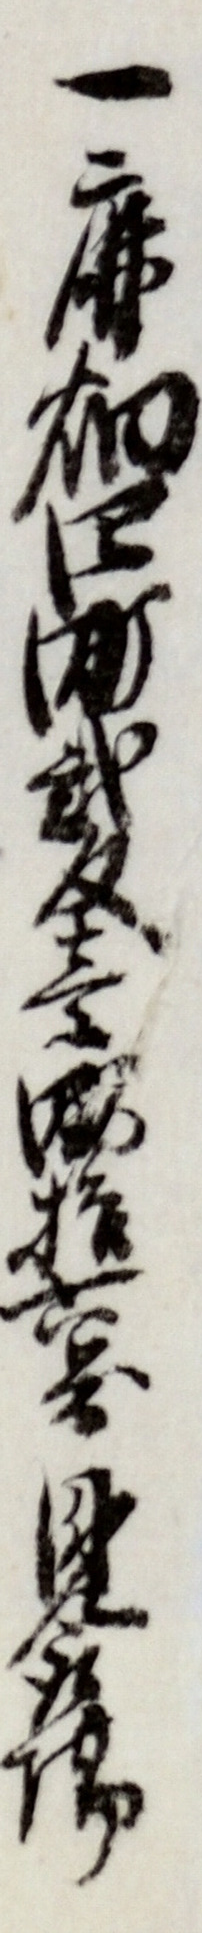一麻畑四町弐反壱畝拾六歩見取場
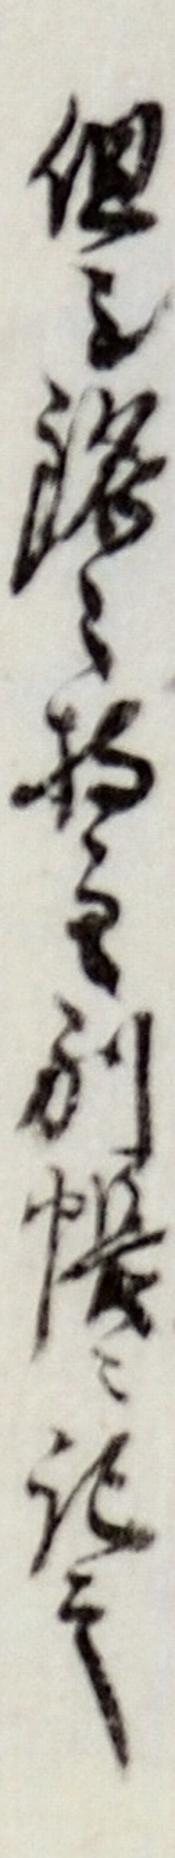但シ銘々持主別帳ニ記之
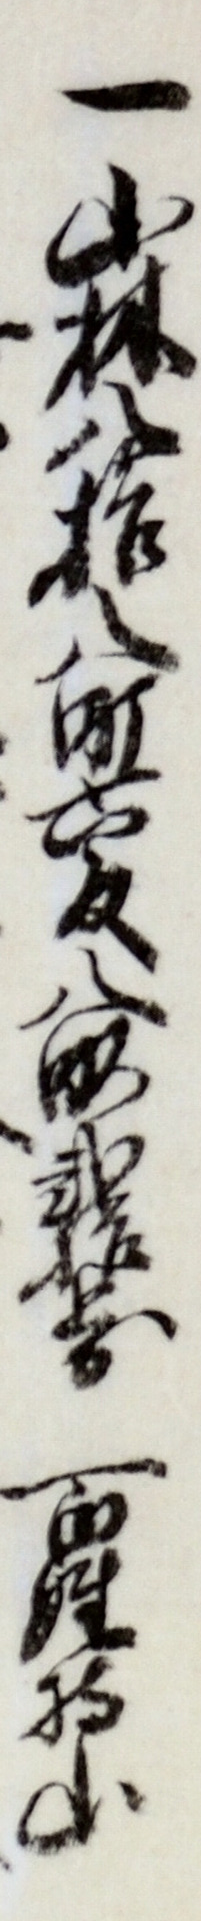一山林八拾八町六反八畝弐拾歩百姓持山
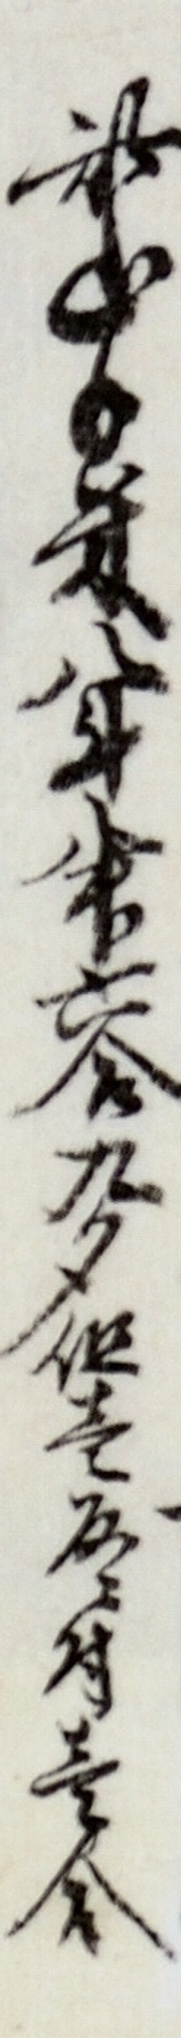此山手米八斗八升六合九勺但壱反ニ付壱合
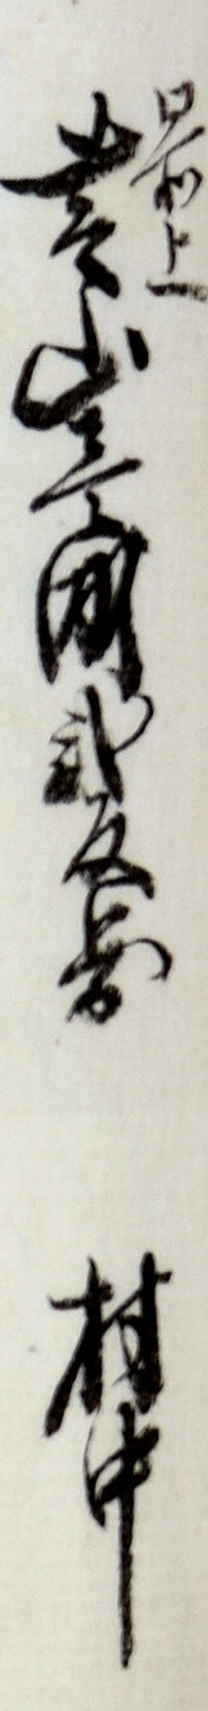芝山壱町弐反歩村中
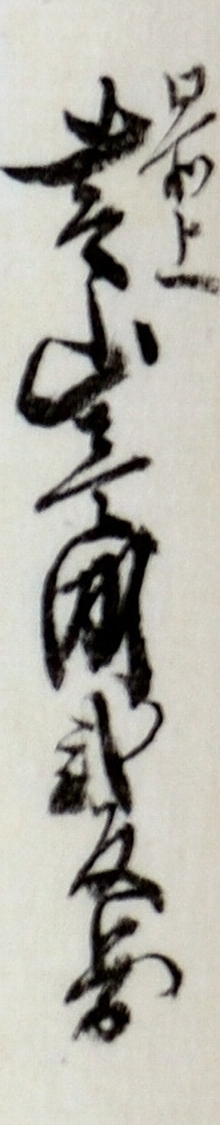芝山壱町弐反歩村中
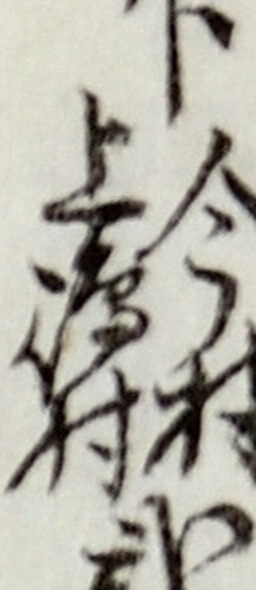上島村
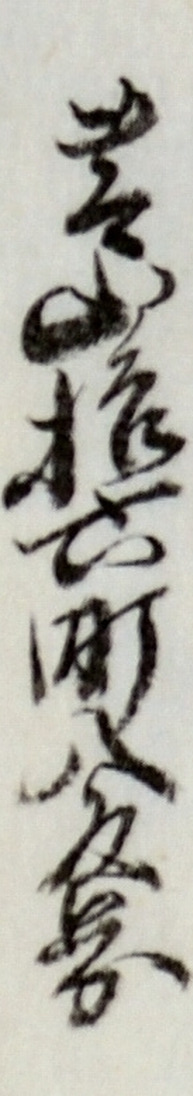芝山拾六町八反歩村中
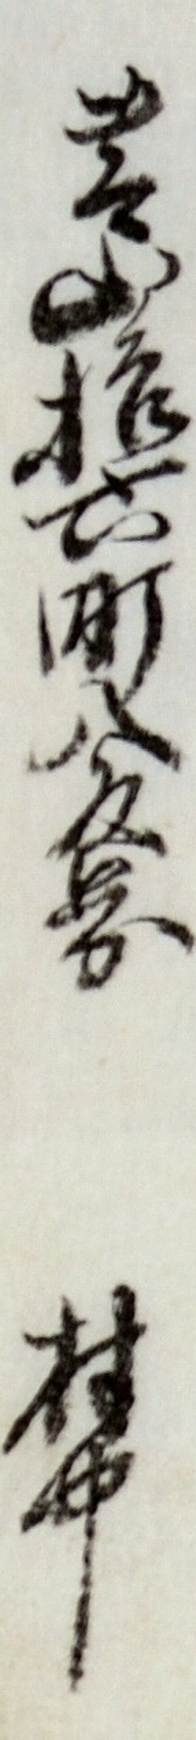芝山拾六町八反歩村中

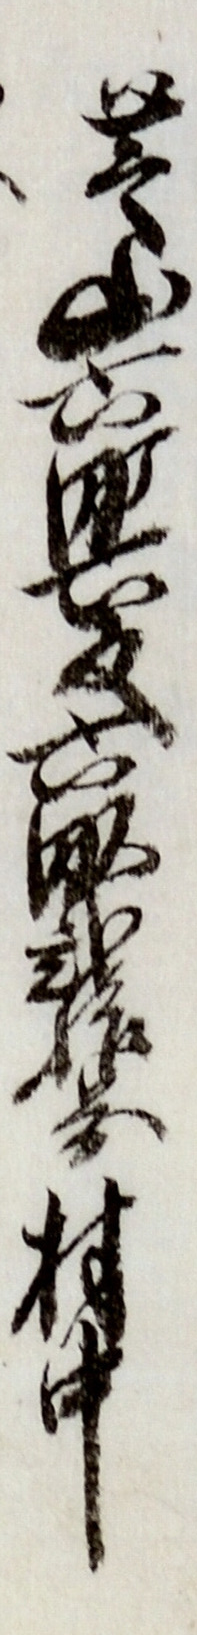芝山六町六反六畝弐拾歩村中
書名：御領分中山林社地手控
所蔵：伊那市立高遠町図書館・合同会社AMANE
